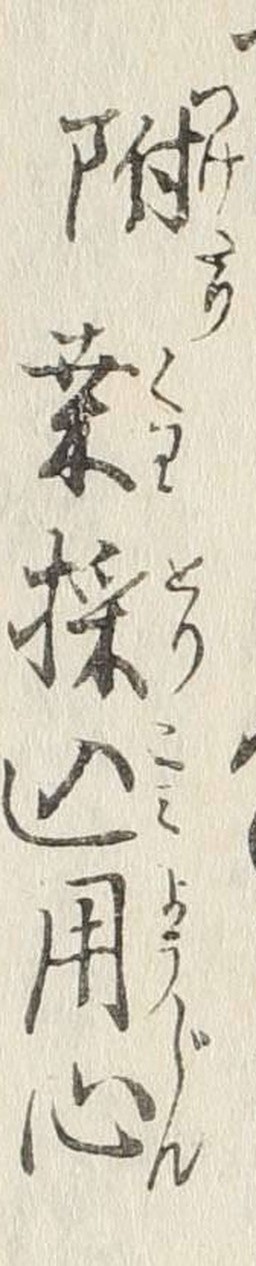附桒採込用心
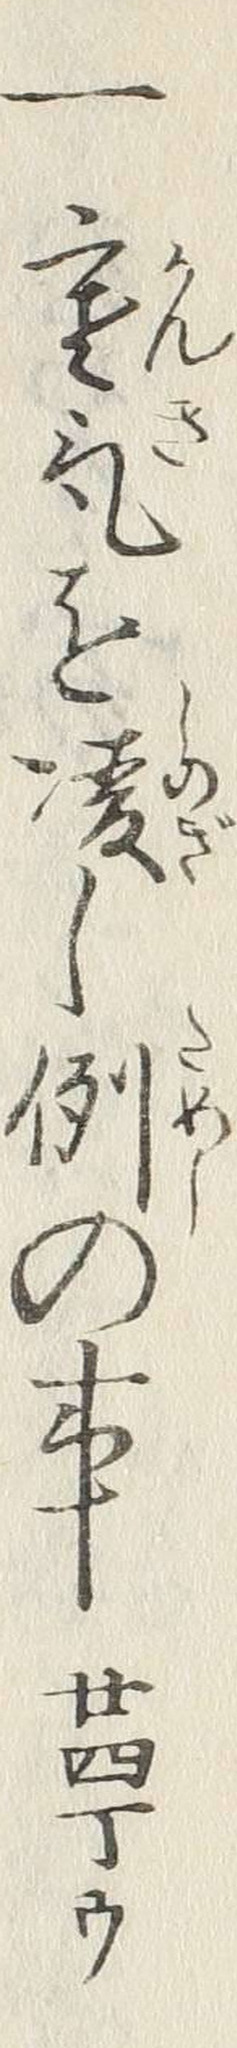一寒気を凌し例の事廿四丁ウ
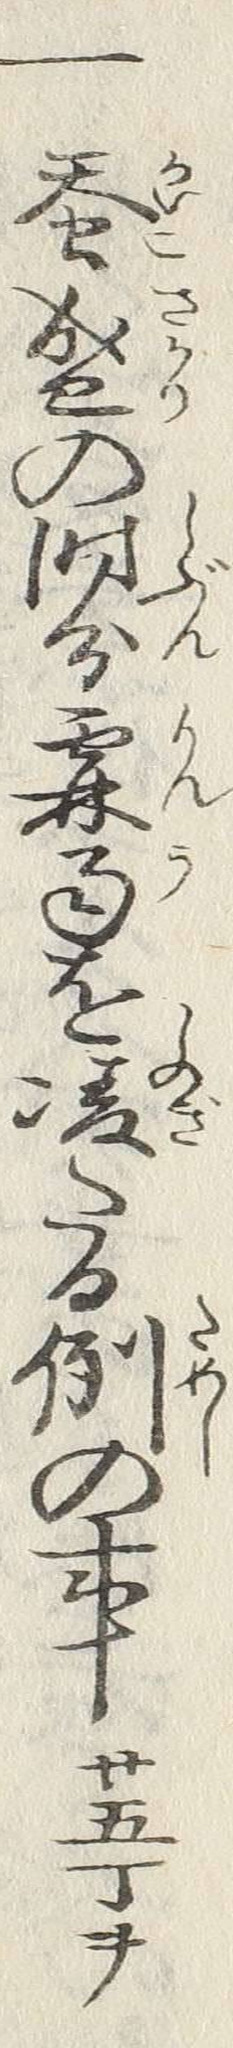一蚕盛の時分霖雨を凌たる例の事廿五丁ヲ
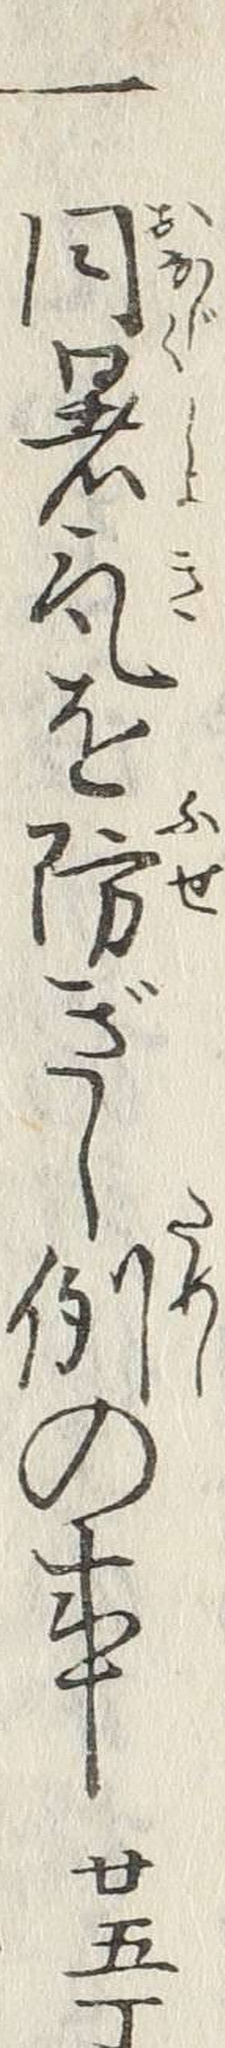一同暑気を防ぎし例の事廿五丁ウ
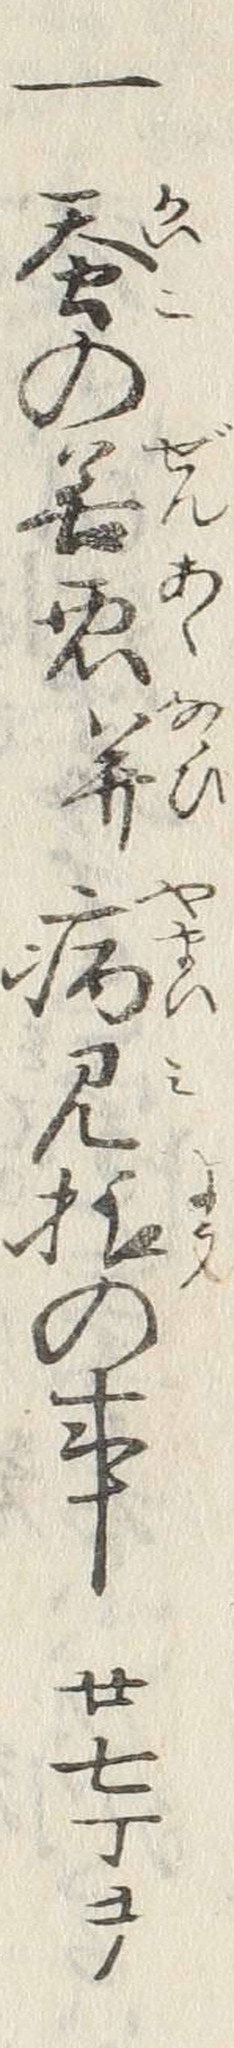一蚕の善悪幷病見様の事廿七丁ヲ
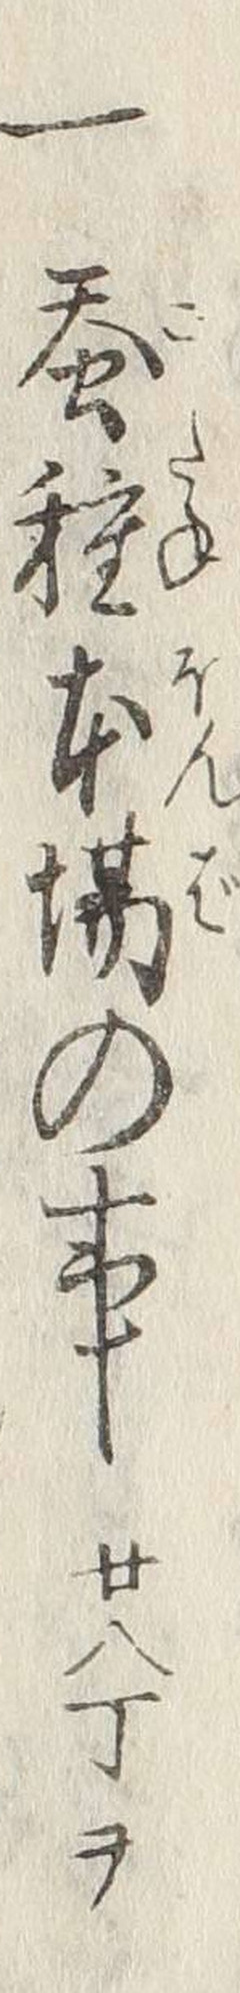一蚕種本場の事廿八丁ヲ
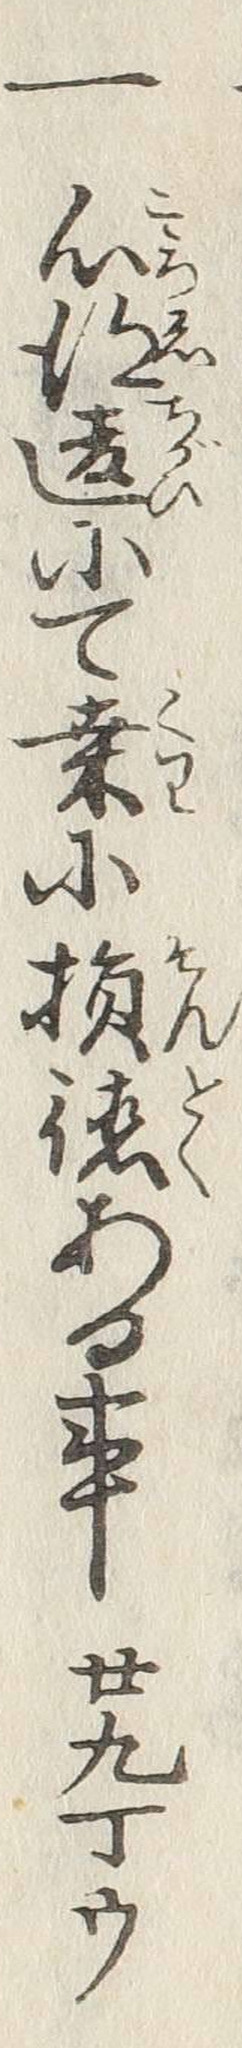一心得違にて桒に損徳ある事廿九丁ウ
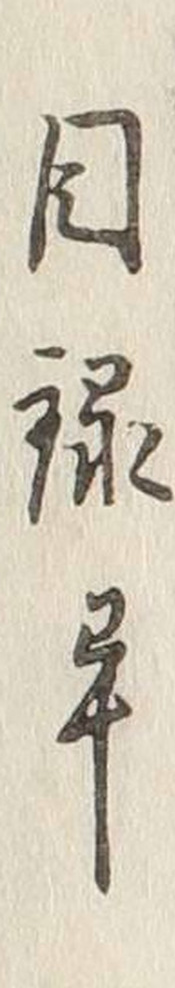目録畢

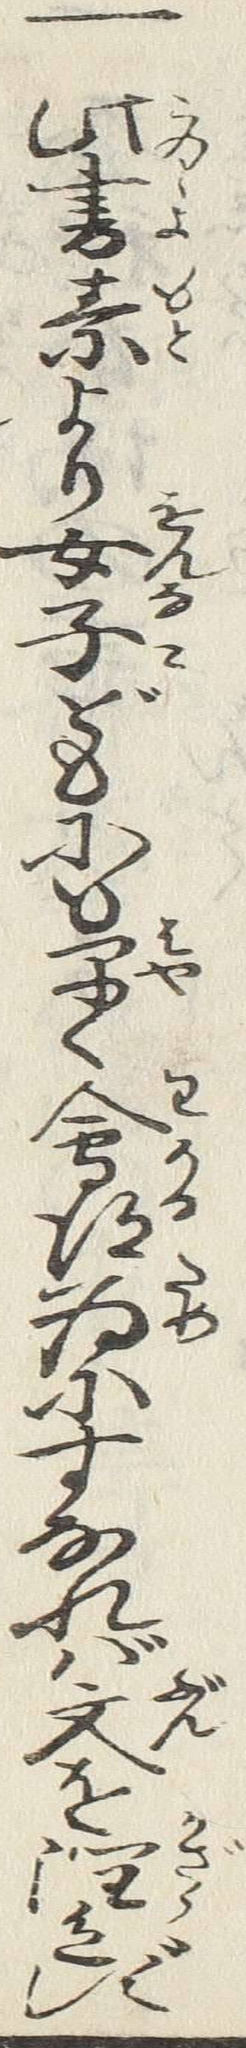一此書素より女子どもにも早く会得為にすなれば文を潤色ず
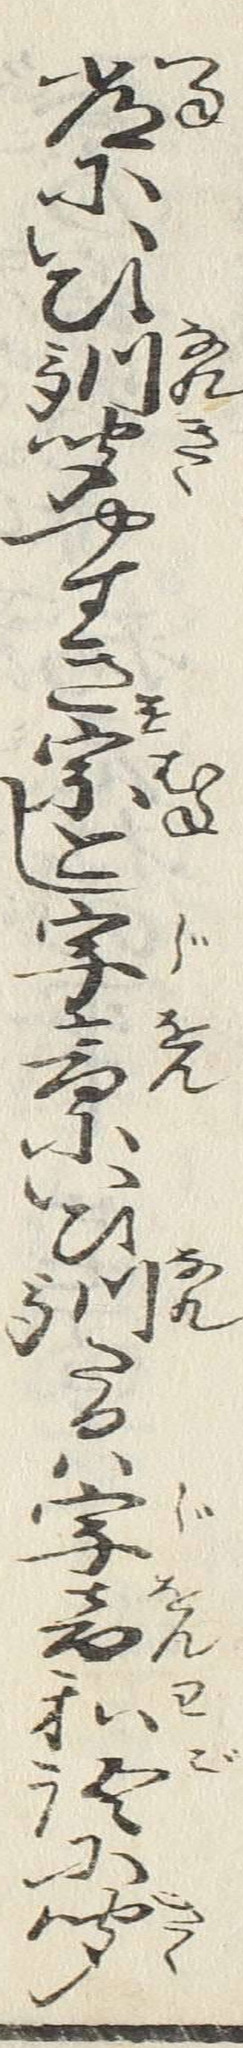常にいひ馴聞やすきを宗とし字音にいひ馴たるは字音和語に聞
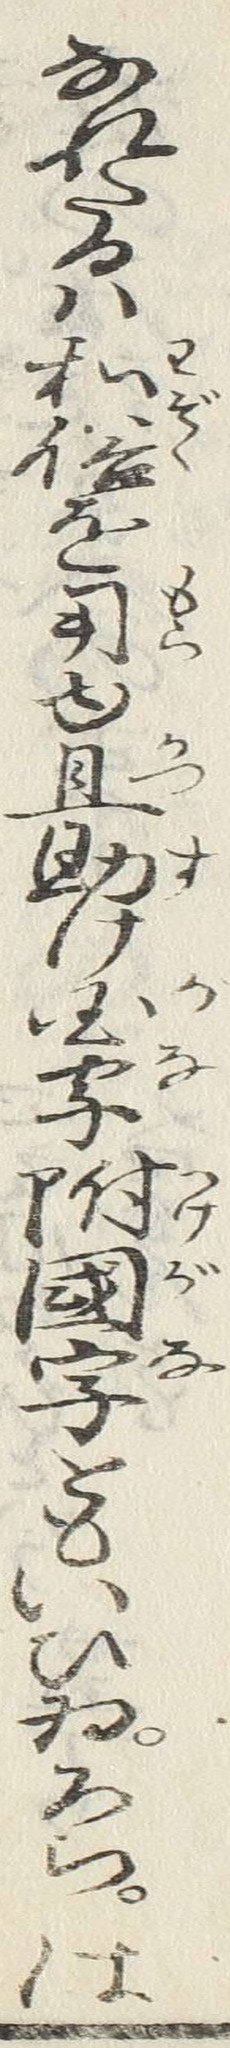なれたるは和俗を用ゆ且助け国字附国字ともいひゐ。ろつ。は
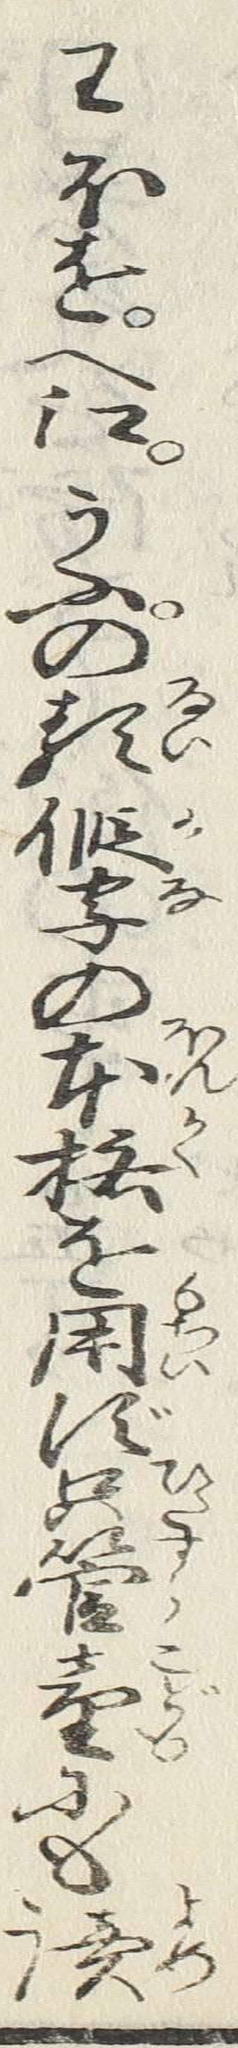わほを。へえ。うふ。の類仮字の本格を用ず只管童にも読
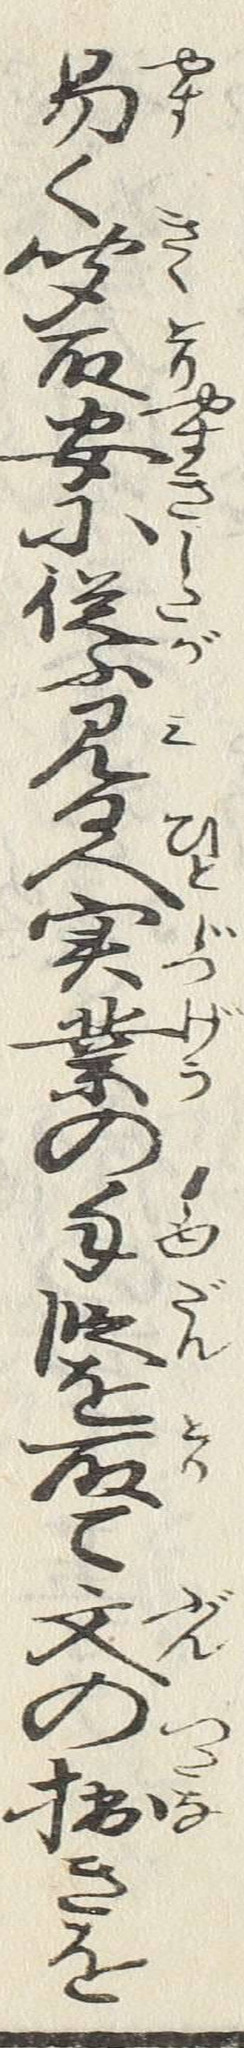易く聞取安に従ふ見る人実業の手段を取て文の拙きを
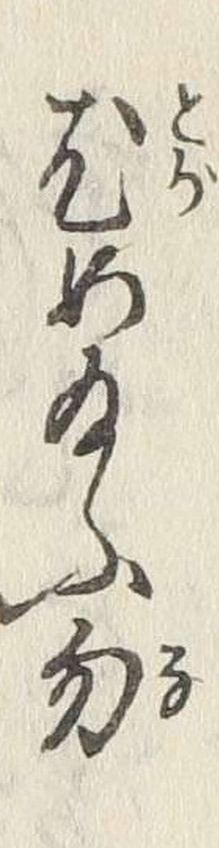尤め給ふ勿
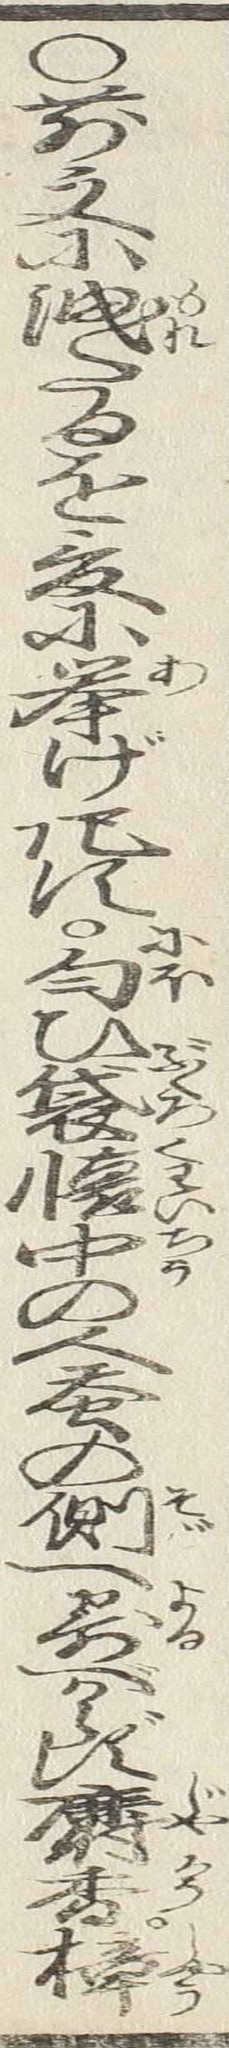○前文に洩たるを爰に挙げ記す。匂ひ袋懐中の人蚕の側へ寄べからず麝香。樟
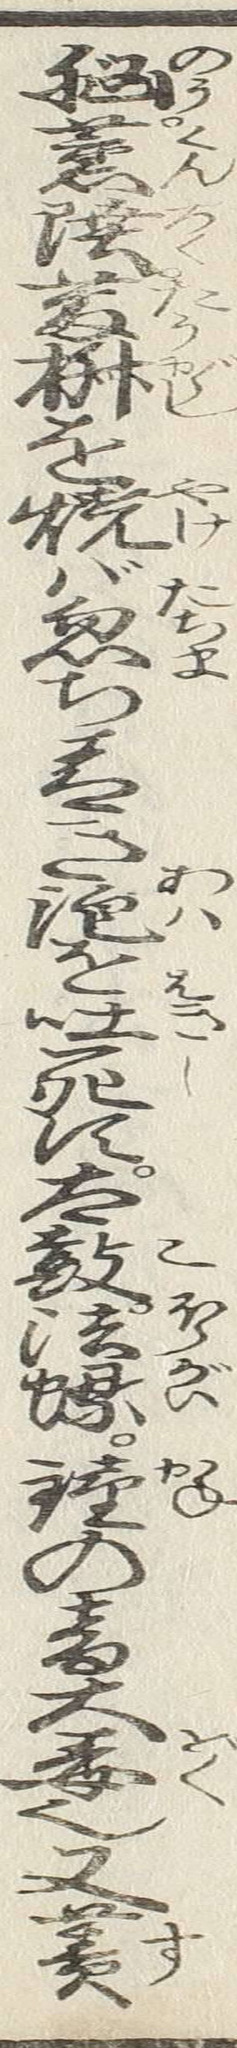脳。薫陸。蕃枡を焼ば忽ち青き泡を吐死す。太皷。法螺。鐘の音大毒也又簀
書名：養蠶實驗録
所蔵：東京大学農学生命科学図書館 国文学研究資料館
